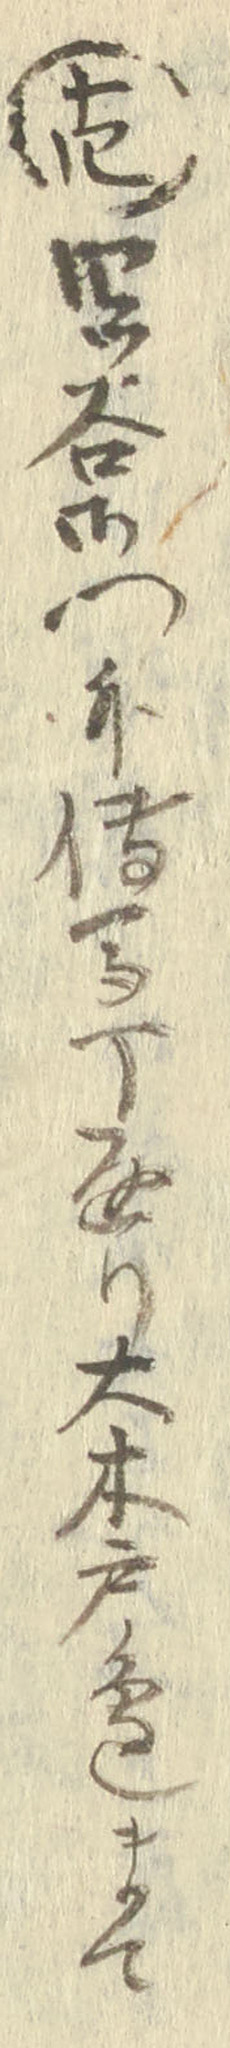十四四ツ谷御門外傳馬丁通り大木戸邊まて
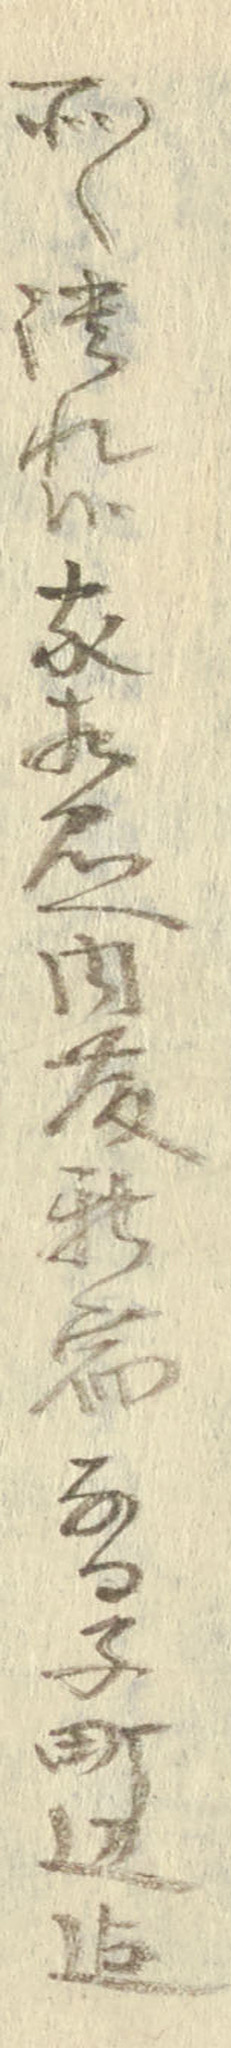所〳〵潰れ候家相見へ内藤新宿なる子町辺迄
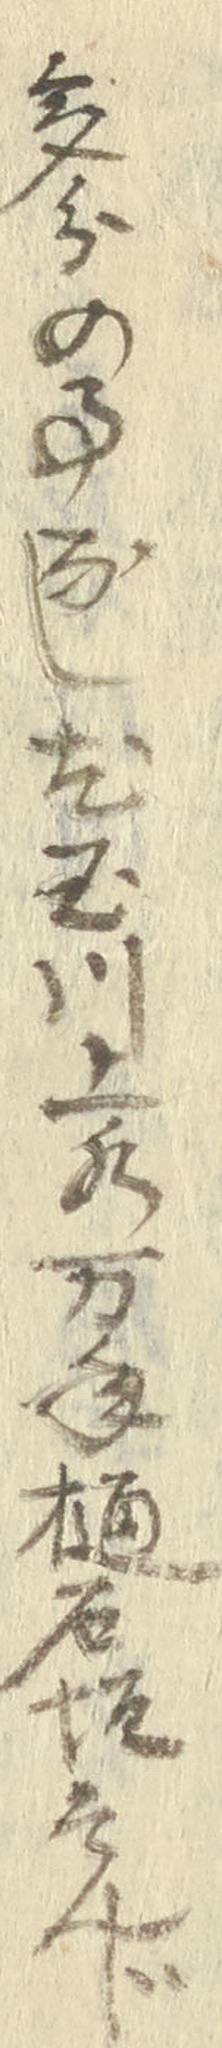多分の事なし尤玉川上水万年樋石坂そんじ
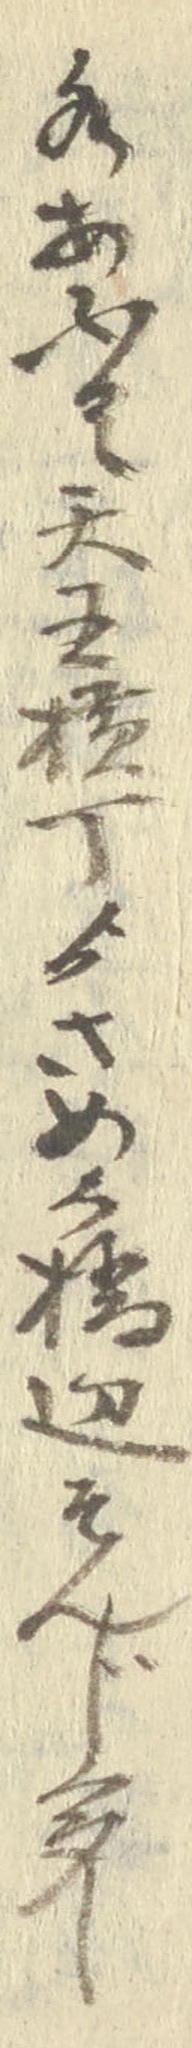水あふるゝ天王横丁ゟさめか橋辺そんじ多し
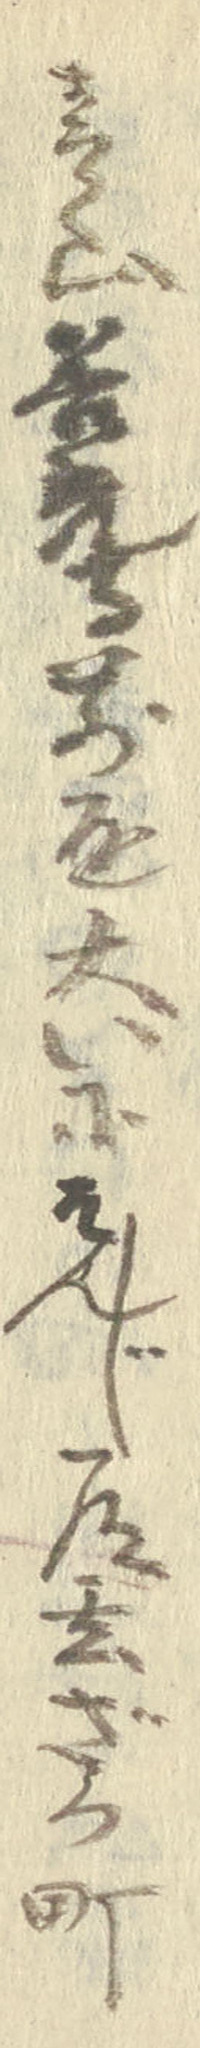青山善光寺前通大いにそんじ道玄ざか町
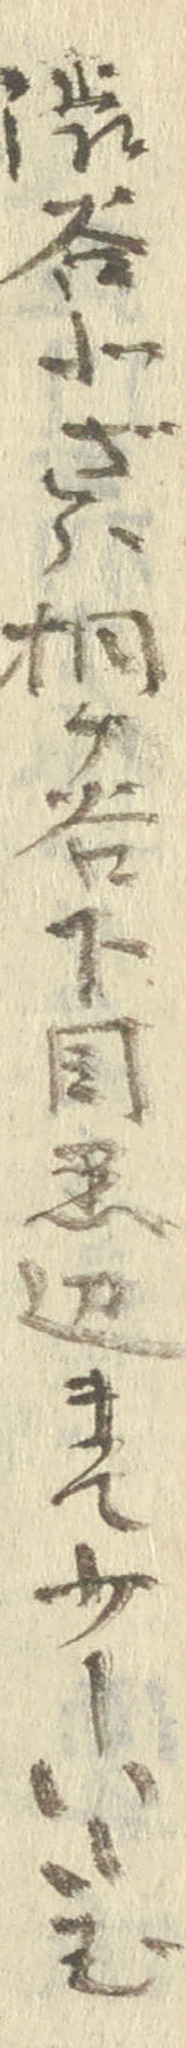渋谷北ざハ桐ヶ谷下目黒辺まて少しいたむ
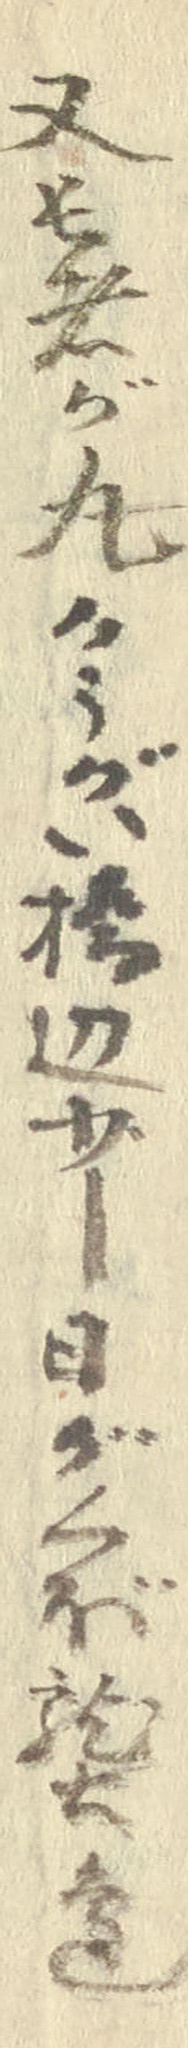又長者が九かうがいはし辺少し日がくぼ壟辺
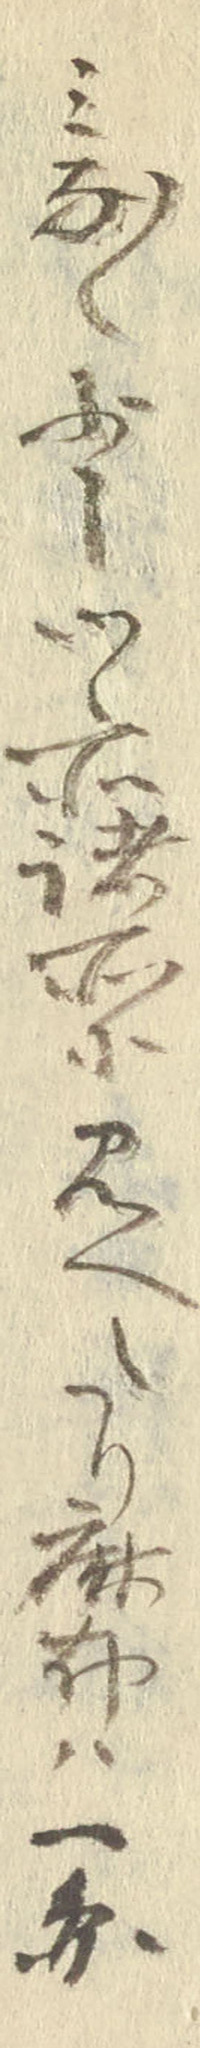ミな〳〵少しツヽ所諸所に見へたり麻布ハ一圓
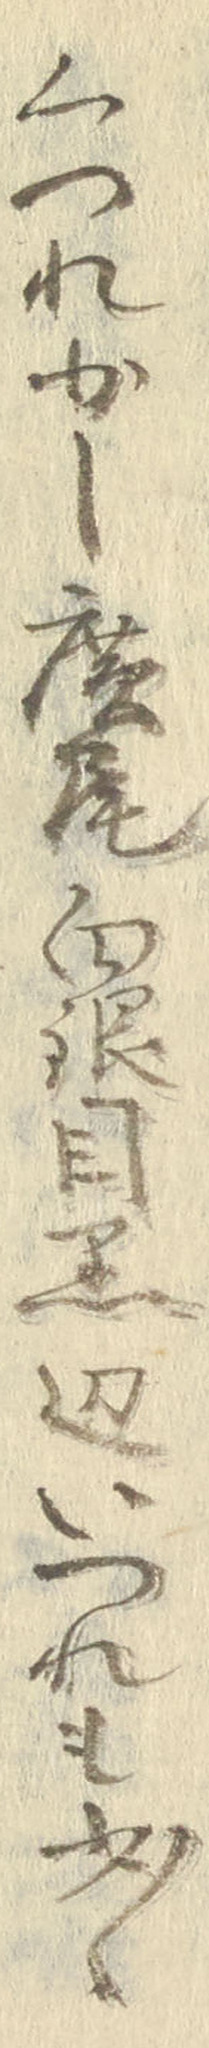くつれ少し廣尾白銀目黒辺いつれも少〳〵
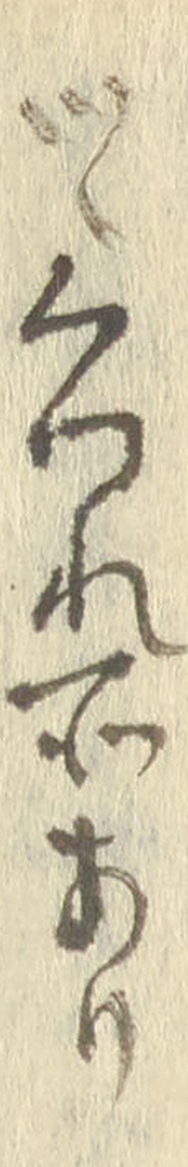ツヽくつれ所あり
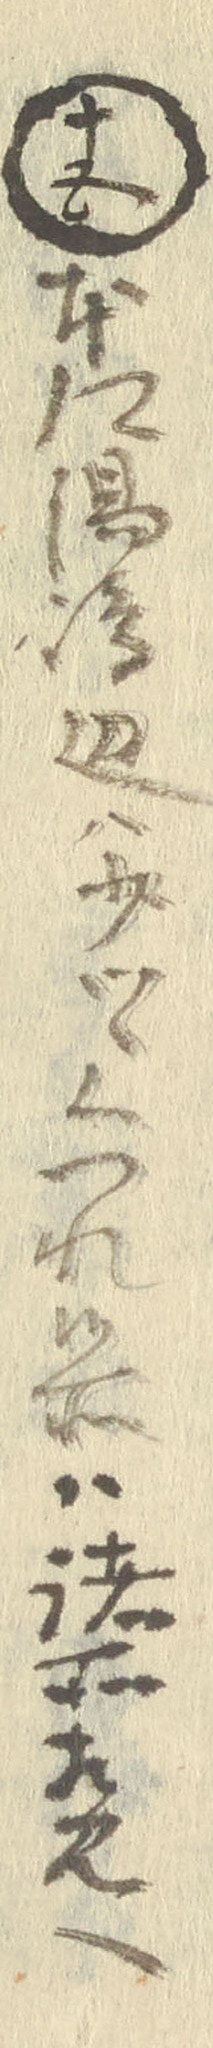十五本郷湯嶋辺ハ少ツヽくつれ候所ハ諸所相見へ
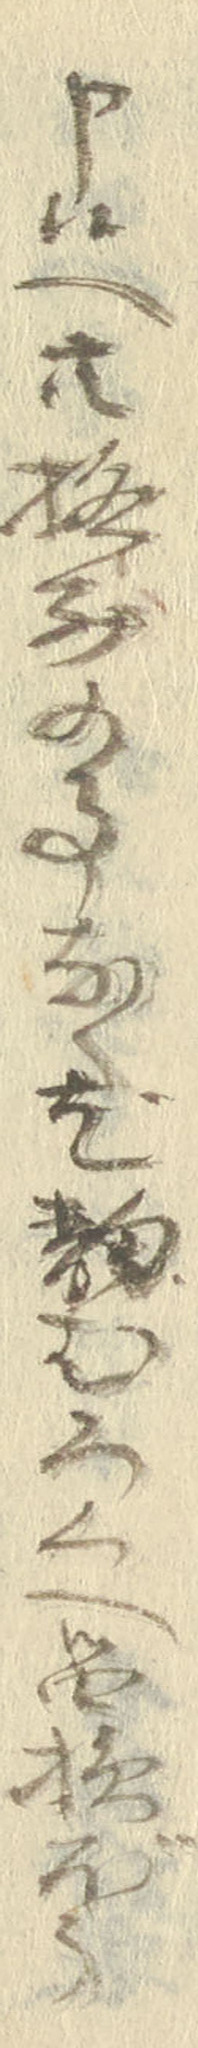申候へ共格別の事なく尤静むろくへ留損ぼう
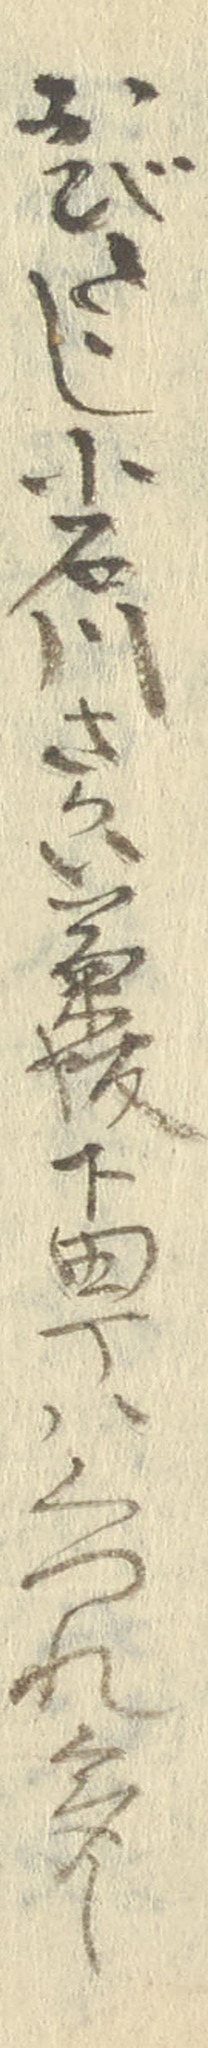おびたゝし小石川さかい菊坂下田丁ハくつれ多し
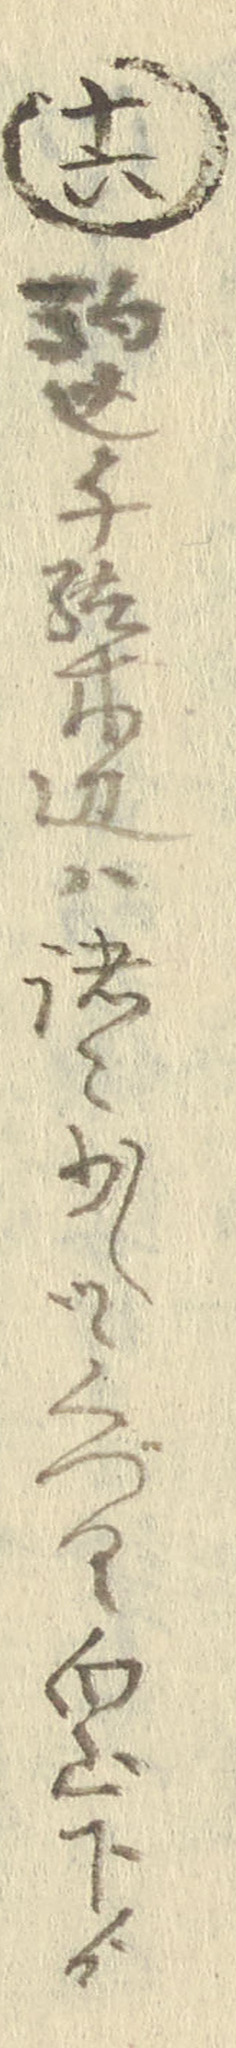十六駒込千駄木辺ハ諸〻少〳〵ツヽくづるゝ白山下ゟ
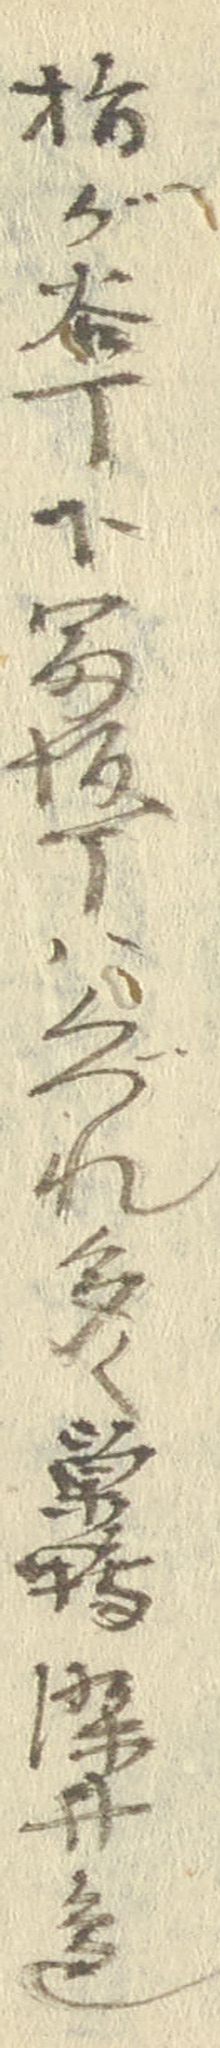指が谷丁下富坂丁ハくづれ多く巣鴨染井邊
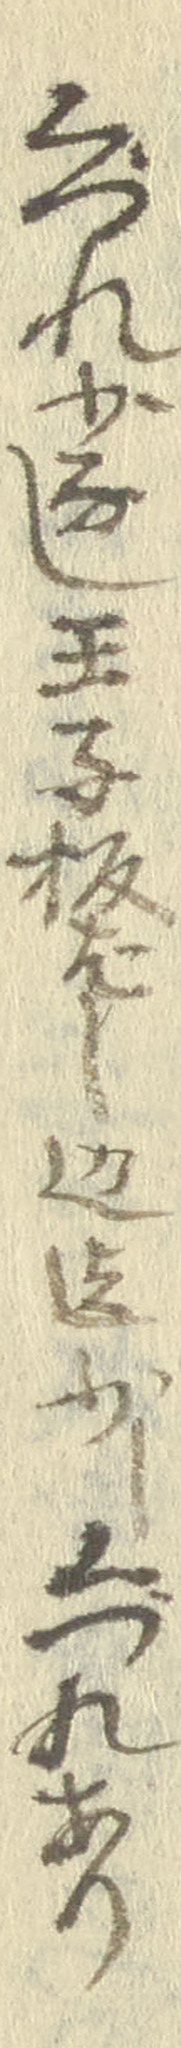くづれ少なし王子板ばし辺迄少しくづれあり
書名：御府内御屋敷方市中共地震類焼場所明細書之冩兼街道筋近郷聞書
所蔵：東京大学総合図書館 General Library in the University of Tokyo, JAPAN
